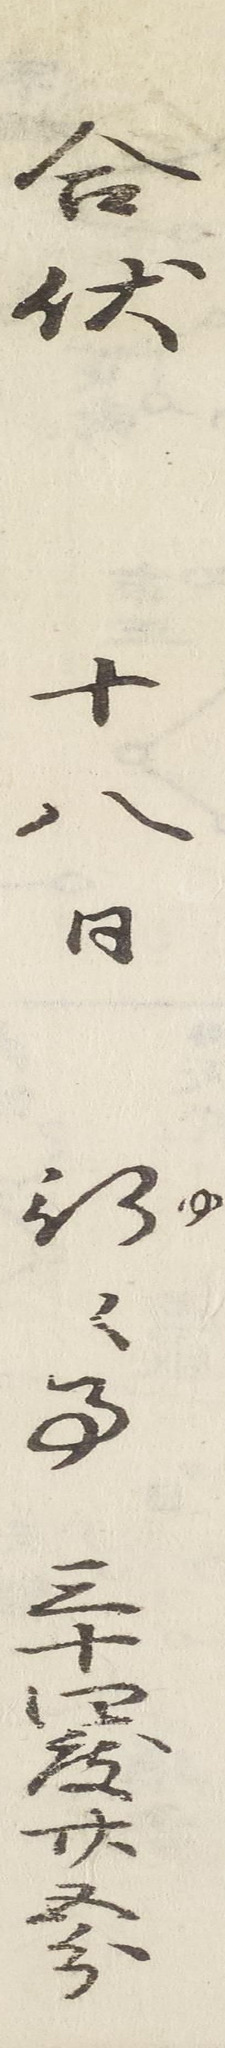合伏十八日行く事三十四度廿五分
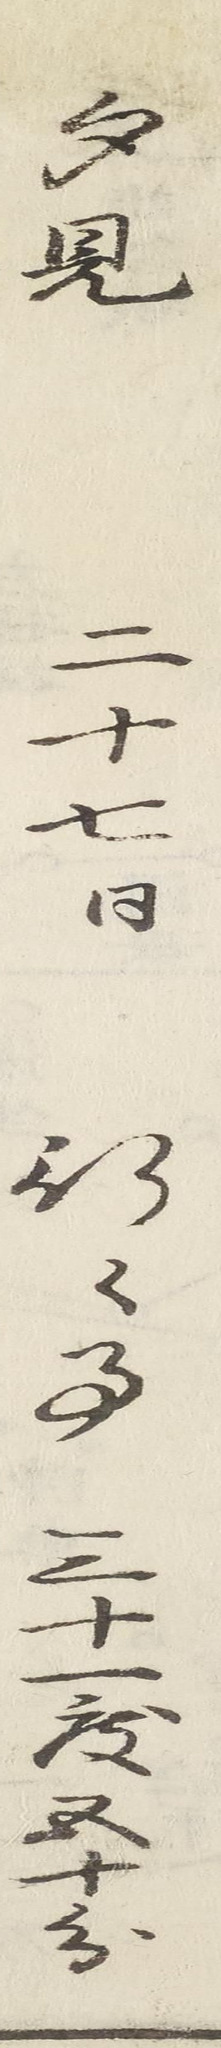夕見二十七日行く事三十一度五十分
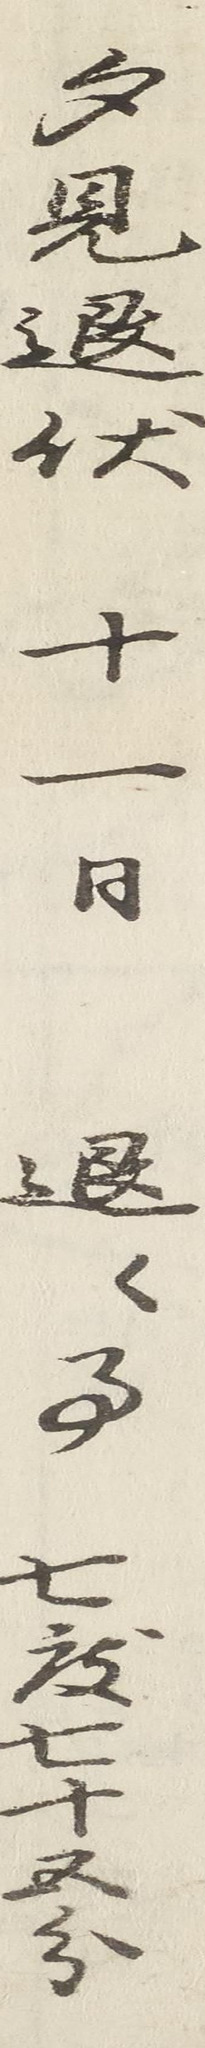夕見退伏十一日退く事七度七十五分
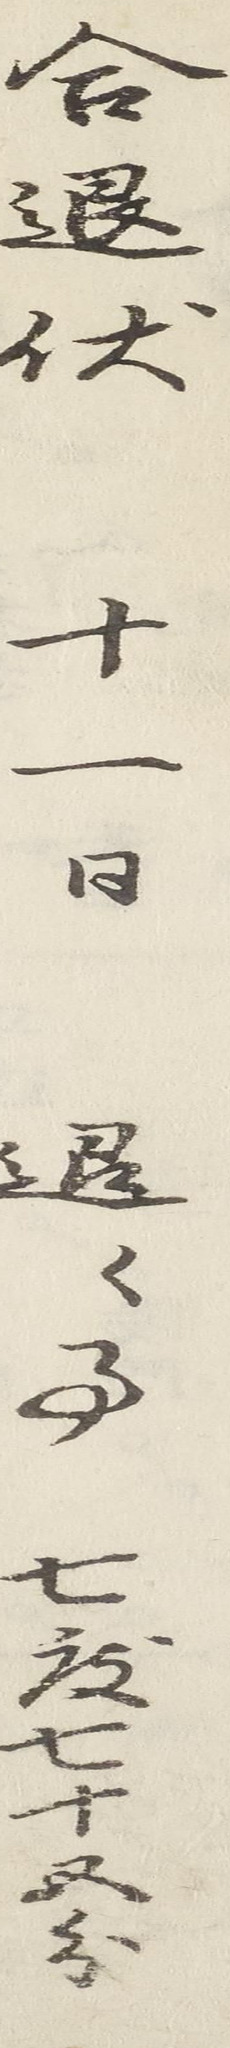合退伏十一日退く事七度七十五分

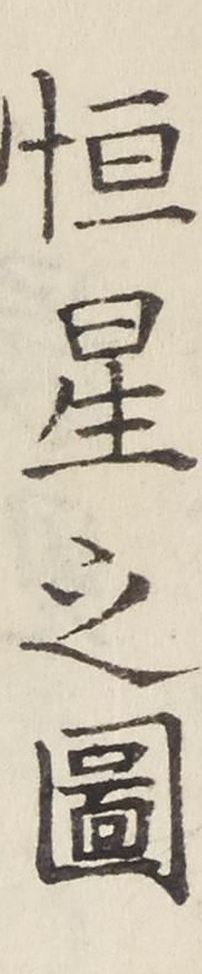恒星之図
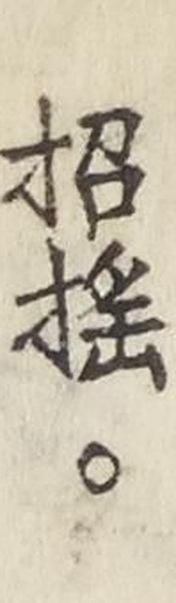招揺氐
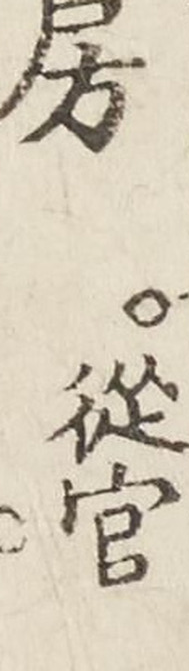房従官
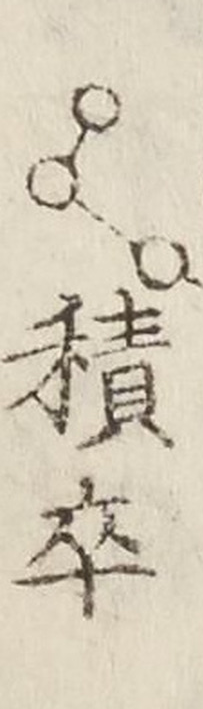心積卒

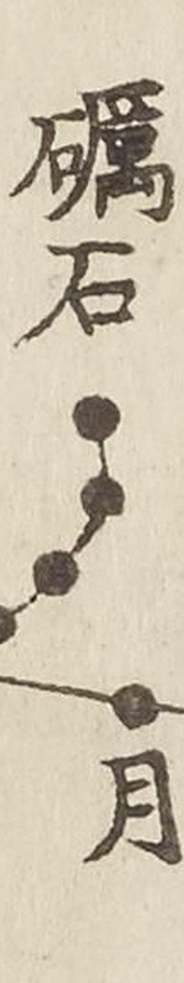礪石月
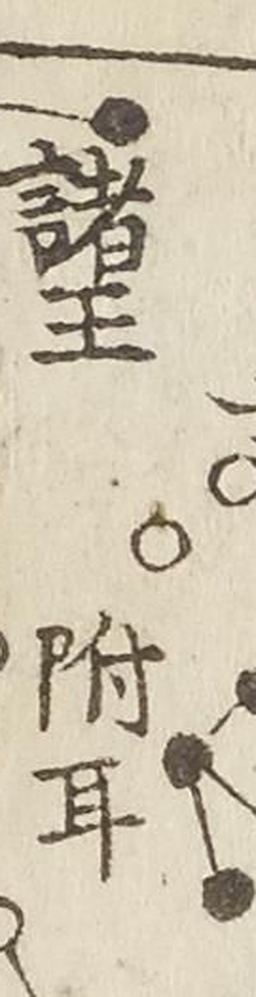柱諸王附耳

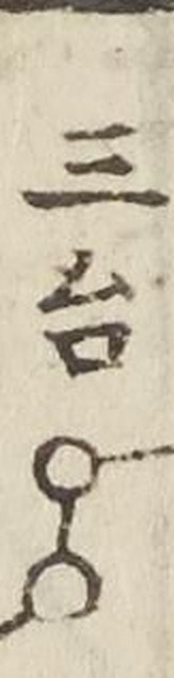三台張
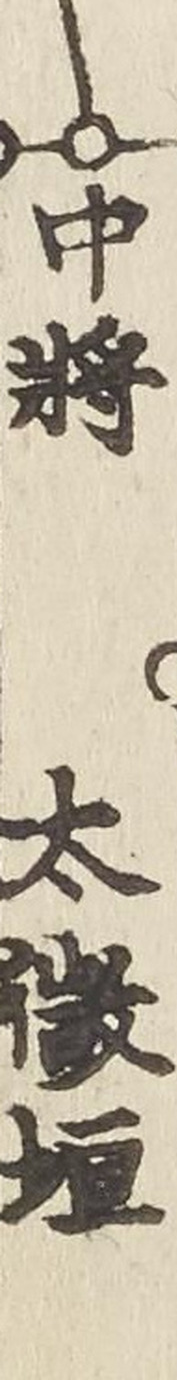中将太徴垣

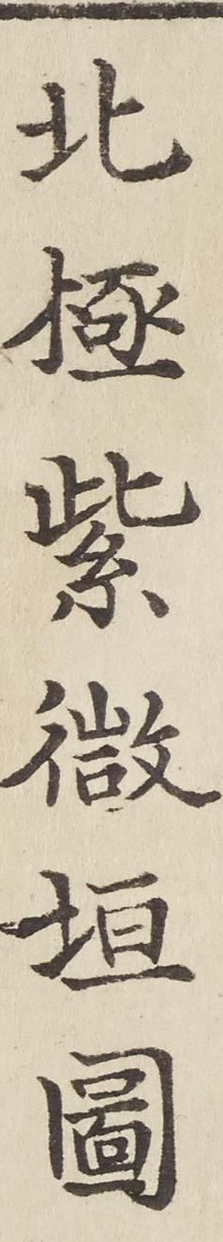北極紫微垣図

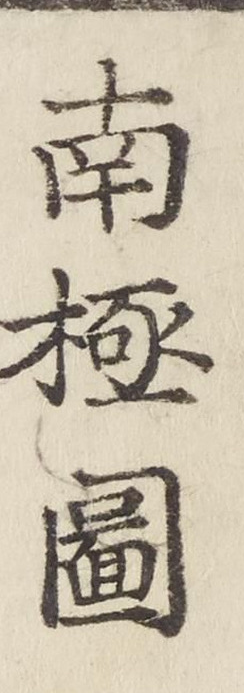南極図

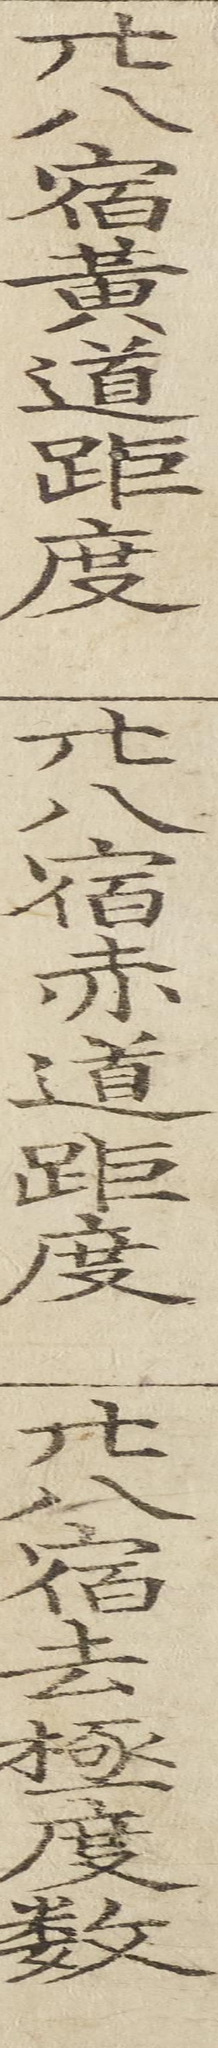廿八宿横道距度廿八宿赤道距度廿八宿去極度数
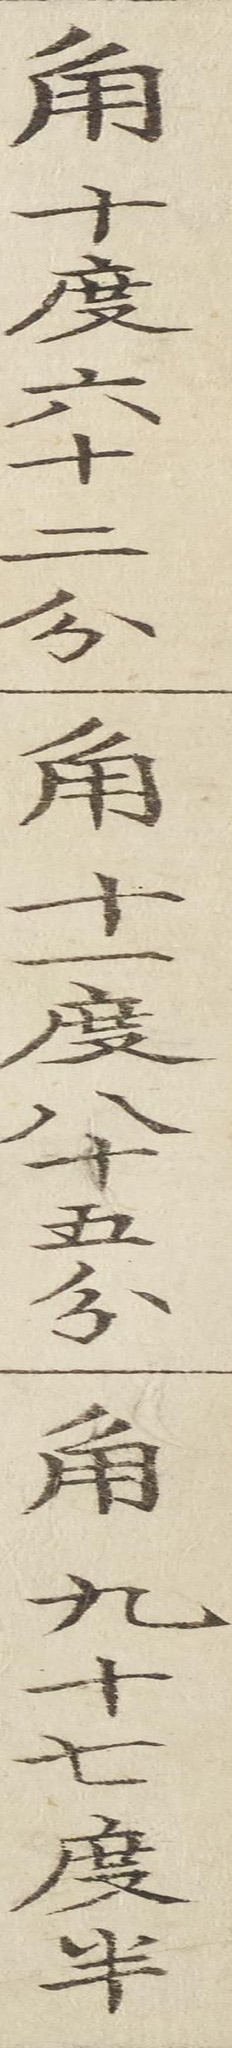角十度六十二分角十一度八十五分角九十七度半
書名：平天儀圖解
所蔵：東京大学地震研究所図書室 Earthquake Research Institute Library, The University of Tokyo, JAPAN
